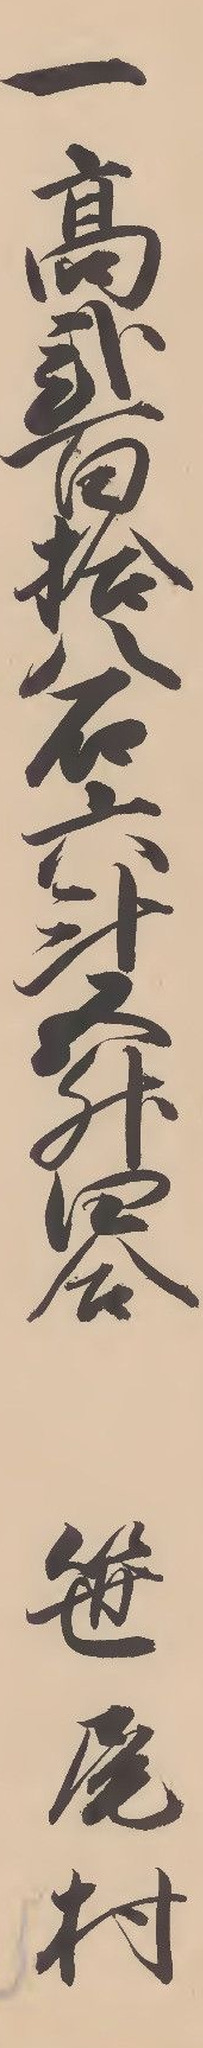一高弐百拾八石六斗五升四合笹尾村
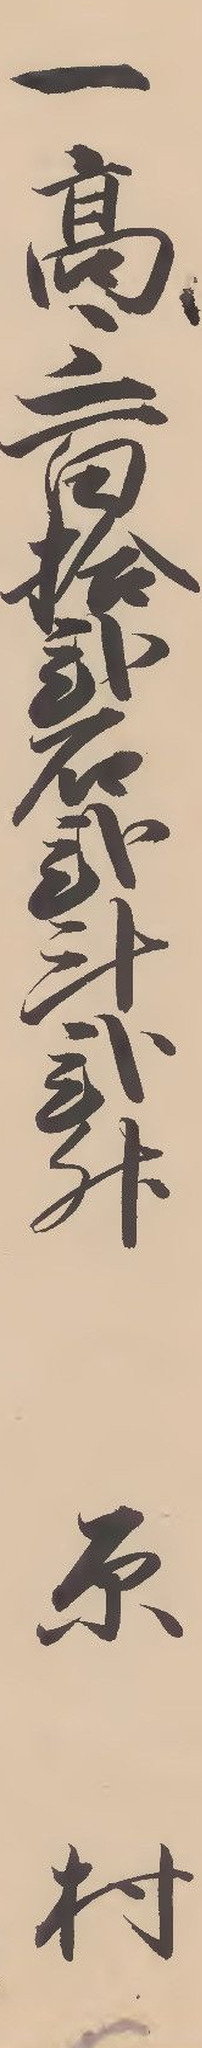一高三百拾弐石弐斗弐升原村
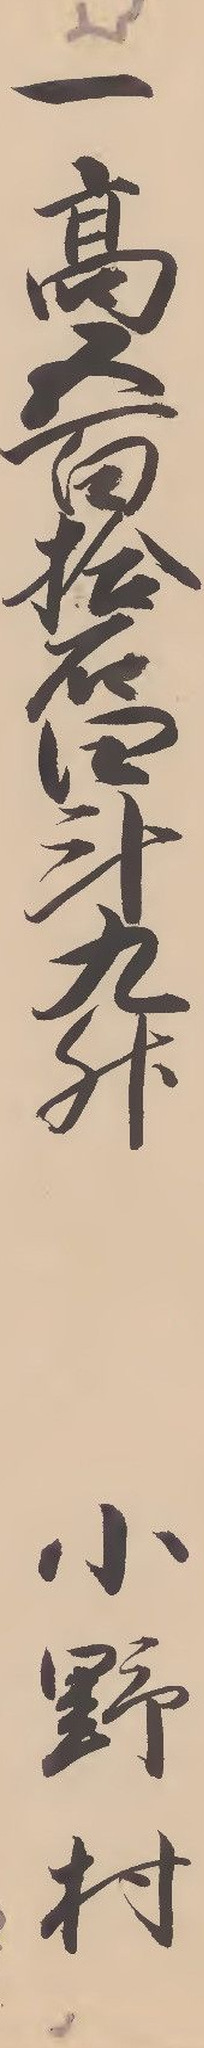一高五百拾石四斗九升小野村
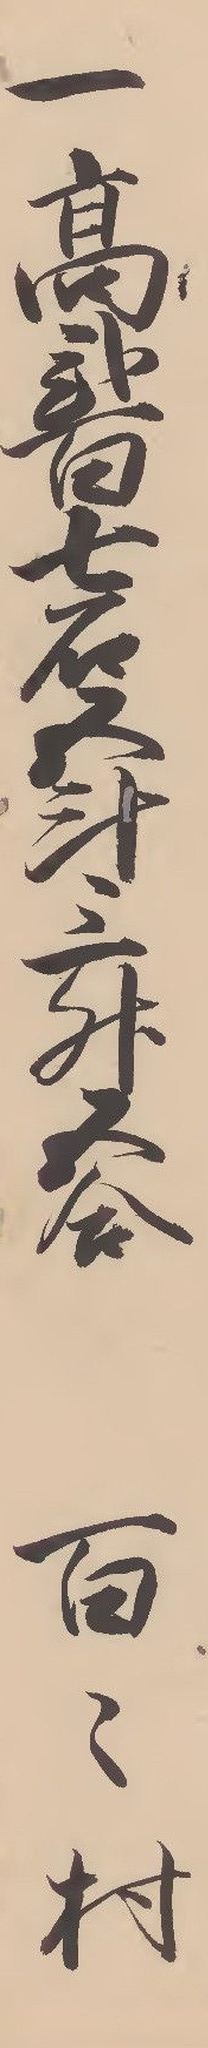一高弐百七石五斗三升五合百々村

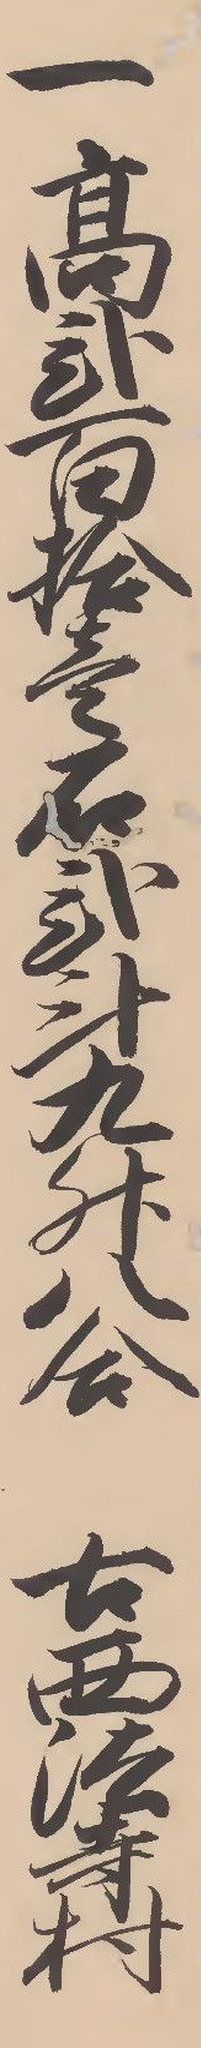一高弐百拾壱石弐斗九升八合古西法寺村
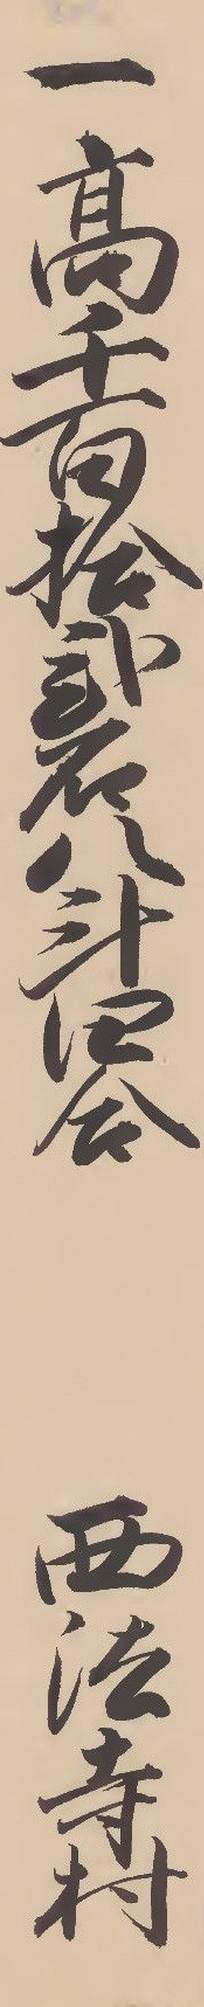一高千百拾弐石八斗四合西法寺村
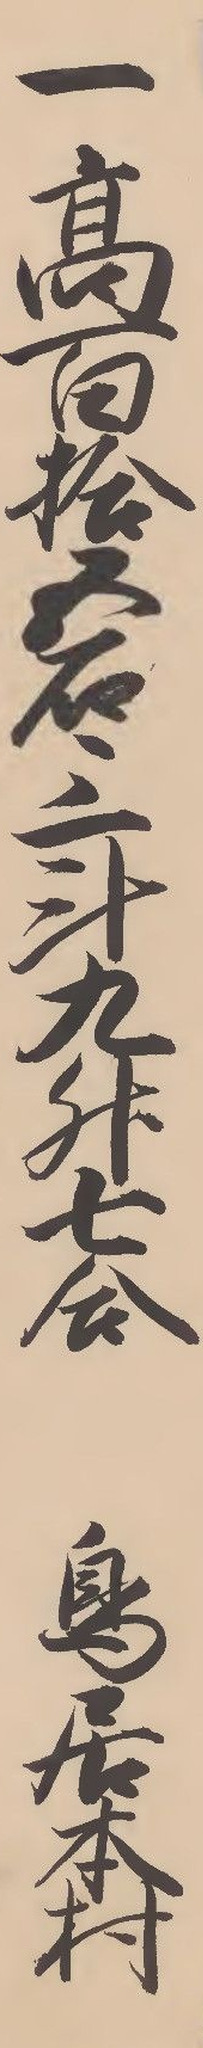一高百拾五石三斗九升七合鳥居本村
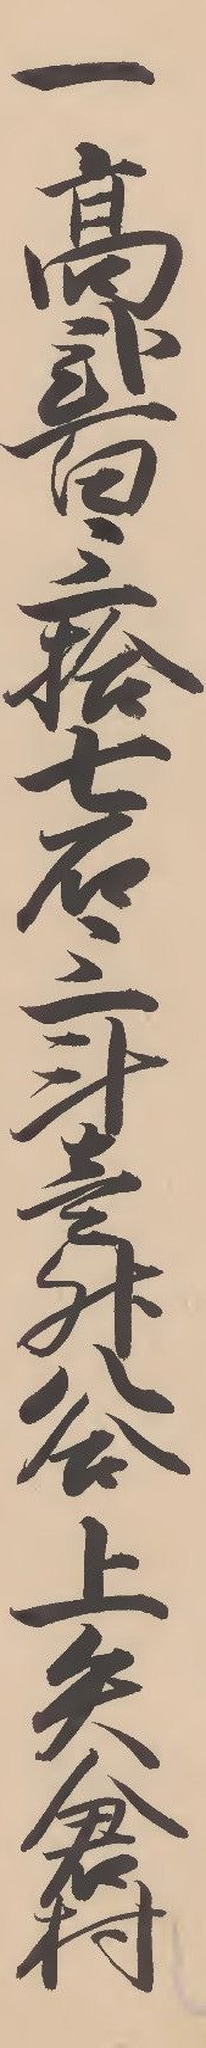一高弐百三拾七石三斗壱升八合上矢倉村
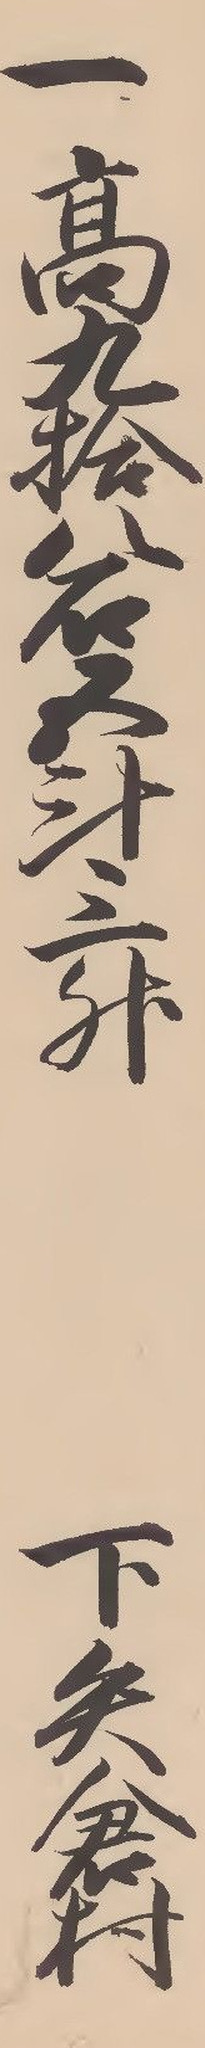一高九拾八石五斗三升下矢倉村
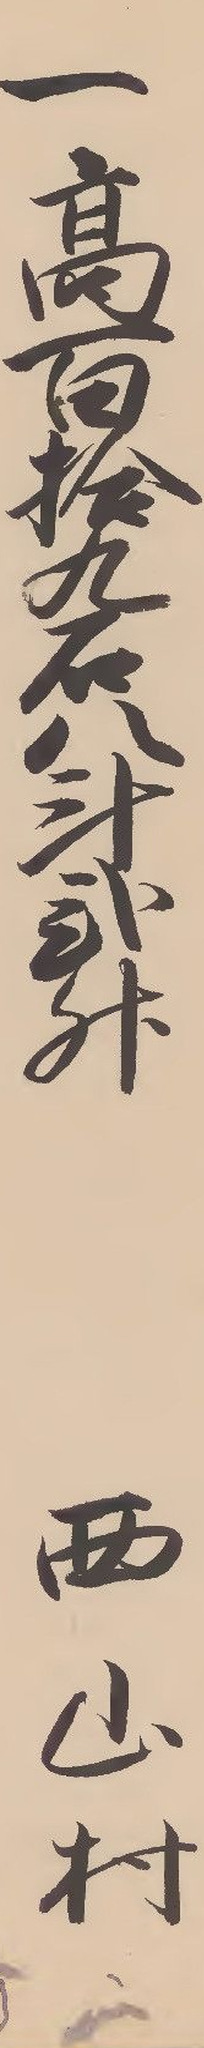一高百拾九石八斗弐升西山村
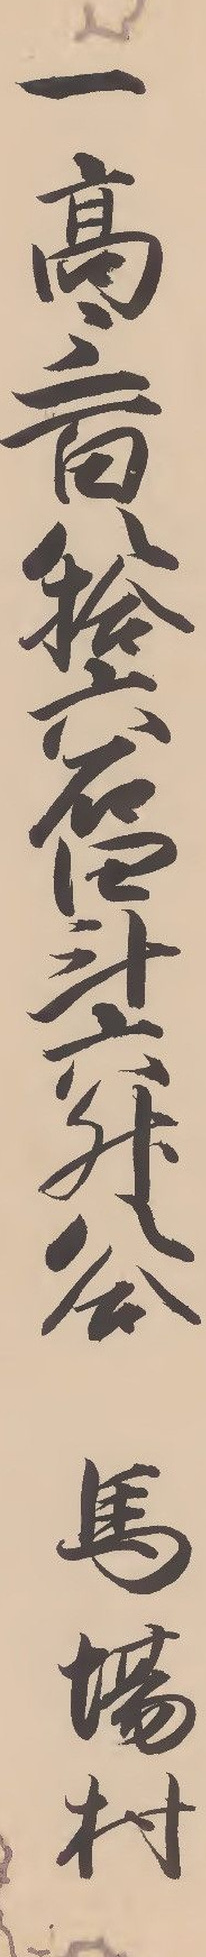一高三百八拾六石四斗六升八合馬場村
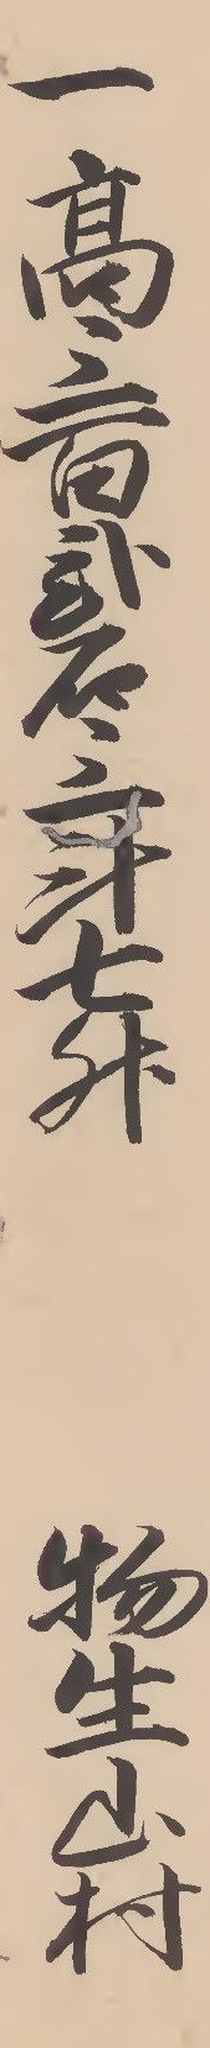一高三百弐石三斗七升物生山村

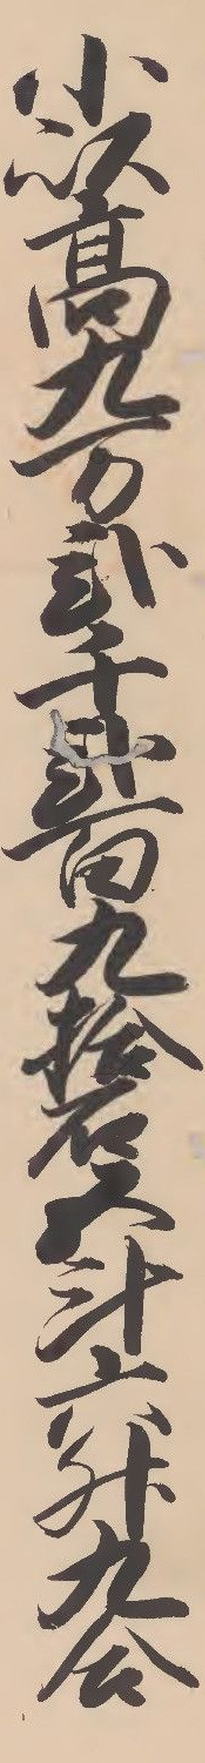小以高九万弐千弐百九拾石五斗六升九合
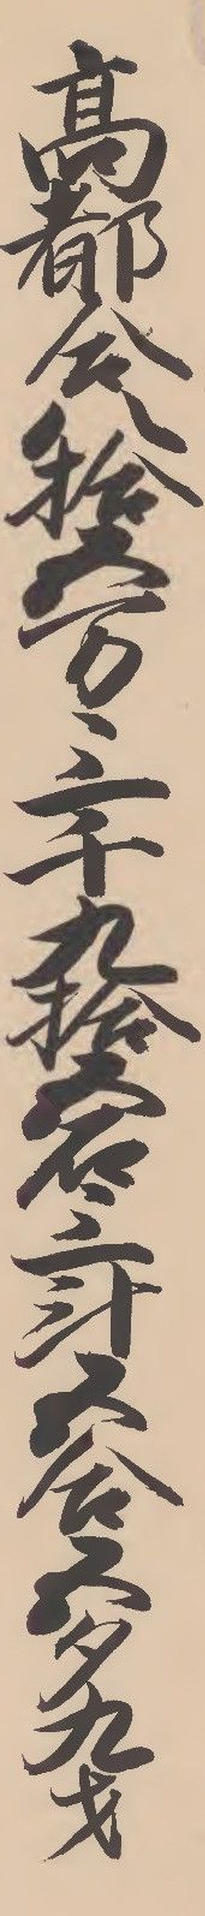高都合八拾五万三千九拾五石三斗五合五勺九才
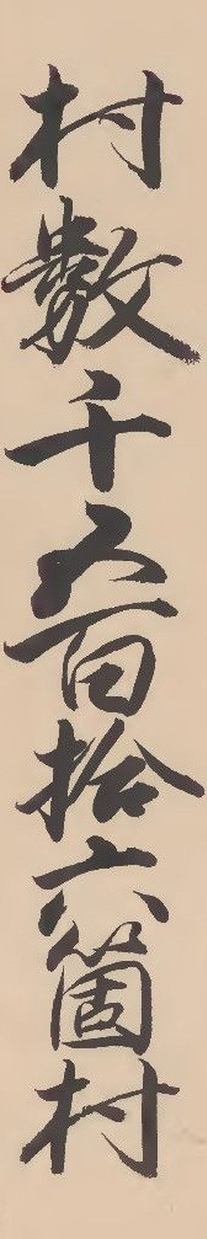村数千五百拾六箇村
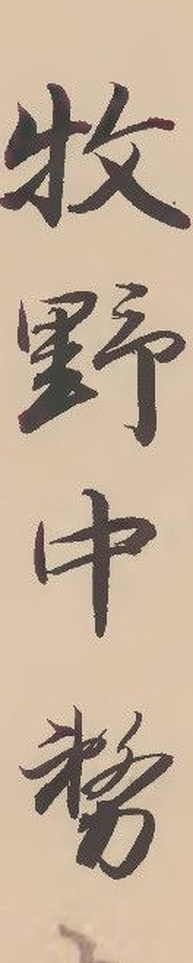牧野中務
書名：近江国郷帳
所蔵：国立公文書館 National Archives of Japan
